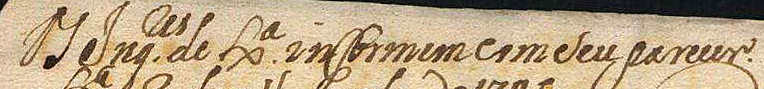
OS Inq.res de lx.a informem com seu parecer.
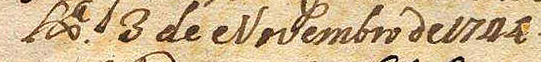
lx.a 3 de Novembro de 1744.
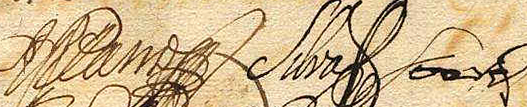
lant̄e Silva Soares
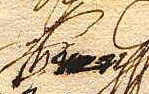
Abreu
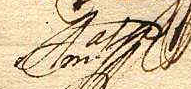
Am.al
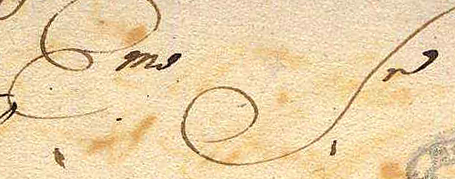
E.mo S.r
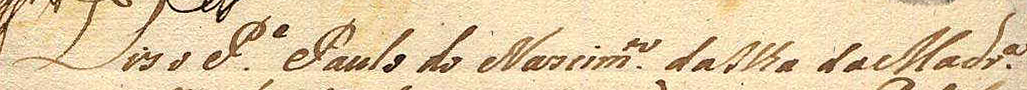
Dis o P.e Paulo do Nascim.to da Ilha da Madr.a
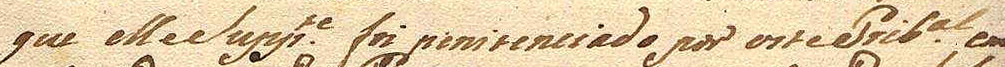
que elle supp.te foi penitenciado por este Trib.al em
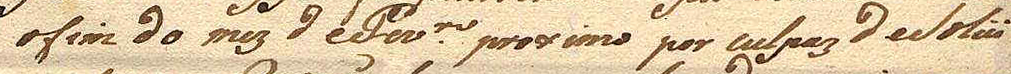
o fim do mez de Fev.ro proximo por culpaz de solici
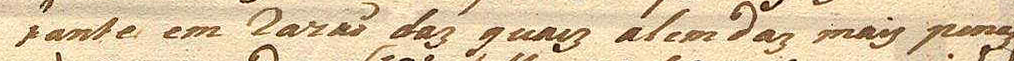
tante em Razaõ daz quaiz alem daz maiz penaz
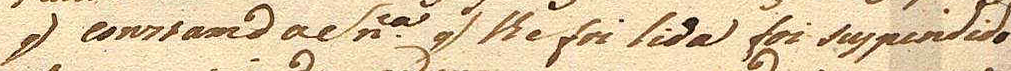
q̄ constam da sn.ça q̄ lhe foi lida foi suspendido
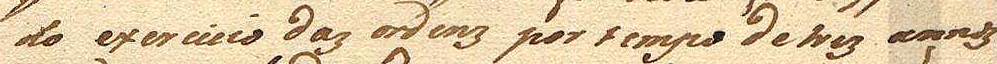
do exercicio daz ordenz por tempo de trez annoz
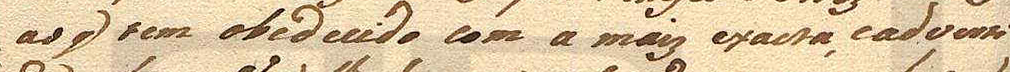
ao q̄ tem obedecido com a maiz exacta, e adverti
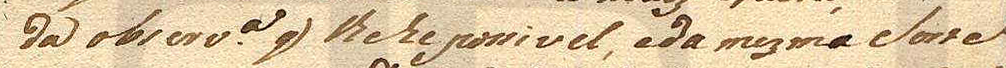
da observ.a q̄ lhe he possivel, e da mezma sorte
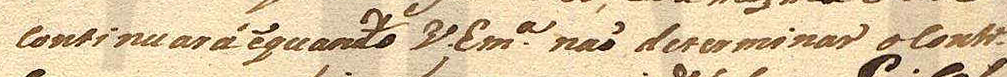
continuará ēquanto V. Em.a naõ determinar o contr.o
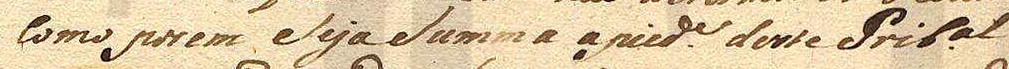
como porem seja summa a pied.e deste Trib.al
